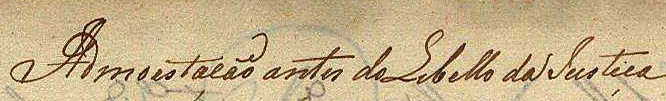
Admoestação antes do Libello da Iustiça
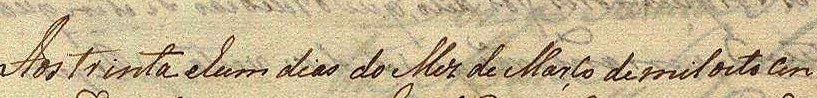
Aos trinta e hum dias do Mez de Março de mil oitocen
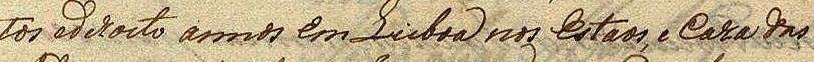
tos e dezoito annos em Lisboa nos Estaos, e Caza das
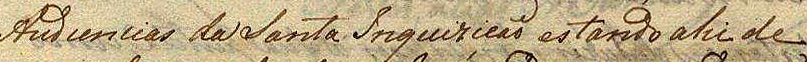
Audiencias da Santa Inquizição estando ahi de
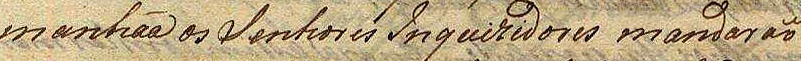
manhãa os Senhores Inquizidores mandaraõ
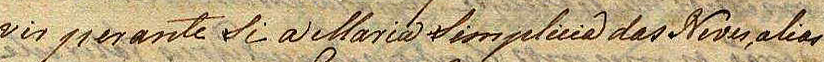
vir perante si a Maria Simplicia das Neves, alias
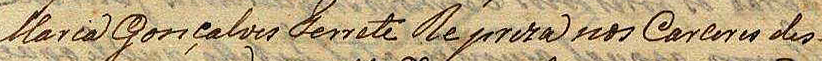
Maria Gonçalves Ferrete Re preza nos Carceres des
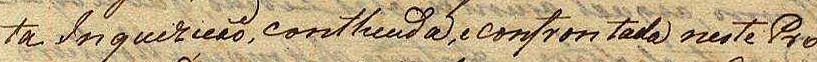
ta Inquiziçaõ, contheuda, e confrontada neste Pro
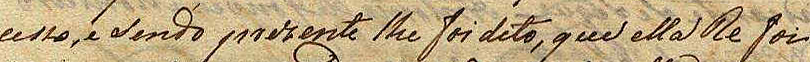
cesso, e sendo prezente lhe foi dito, que ella Re foi
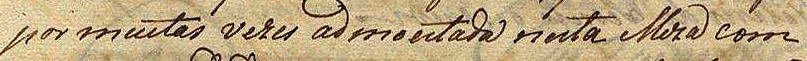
por muitas vezes admoestada nesta Meza com
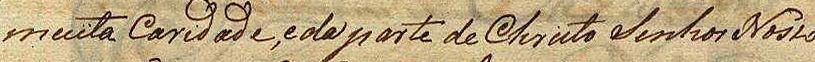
muita Caridade, e da parte de Christo Senhor Nosso
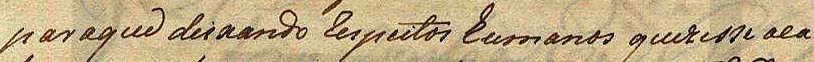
para que deixando Respeitos humanos quezesse aca
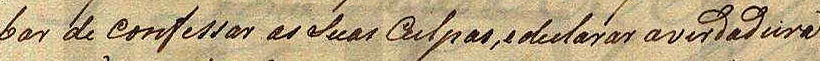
bar de confessar as suas culpas, e declarar a verdadeira
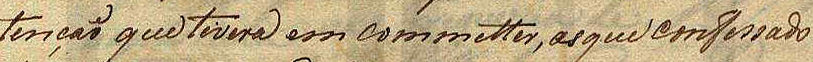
tençaõ que tivera em commetter, as que confessado
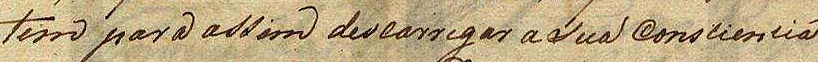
tem para assim descarregar a sua consciencia
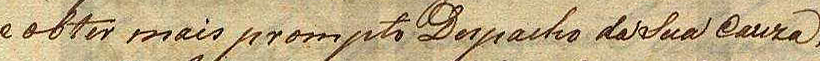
e obter mais prompto Despacho da Sua cauza;
